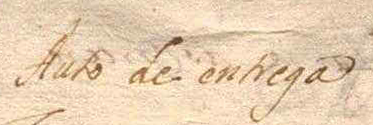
Auto de entrega
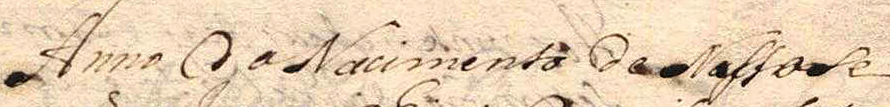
Anno do Nacimento de Nosso se
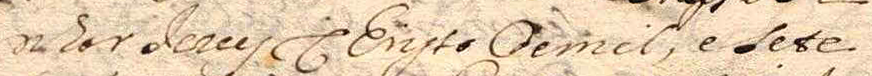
nhor Iesus Christo de mil, e sete
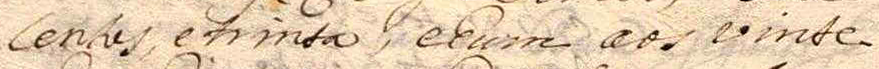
centos, e trinta, e hum aos vinte
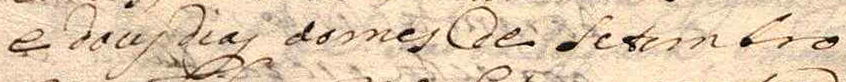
e dous dias do mes de Setembro
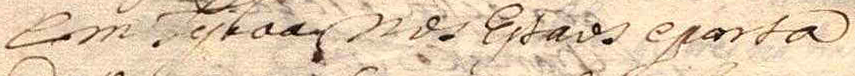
em Lisboa nos Estaos e porta
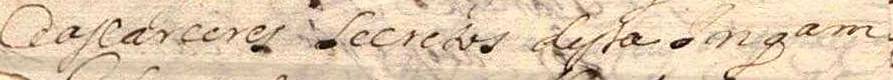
dos carceres secretos desta Inqam
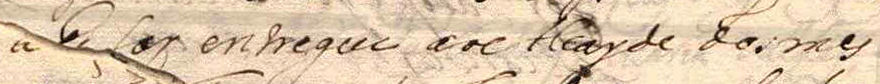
ahi foy entregue ao Alcayde dos mes
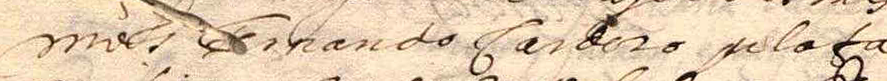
mos Fernando Cardozo pelo fa
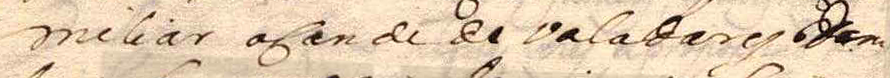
miliar o Conde de valadares Dom
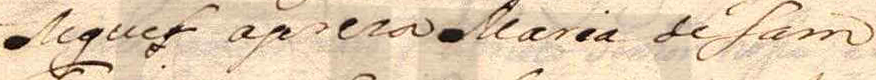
Mguel a preza Maria de sam
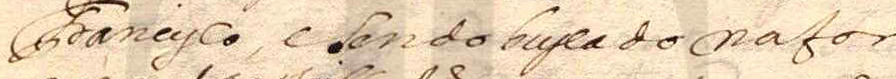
Francisco, e sendo buscado na for
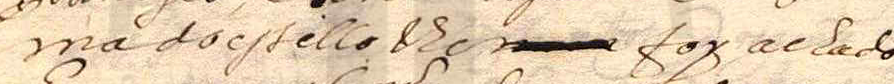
ma do estillo lhem_ foy achado
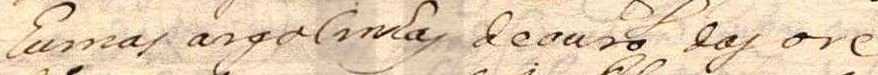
humas argolinhas de ouro das ore
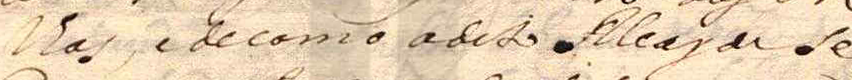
lhas, e de como o dito Alcayde se
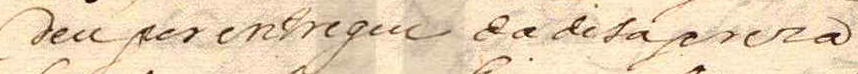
deu per entregue da dita preza
